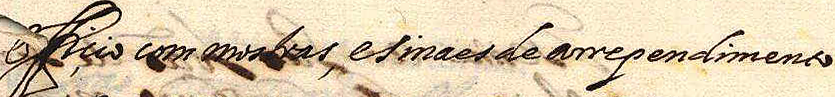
Offiçio com mostras, e sinaes de arrependimento
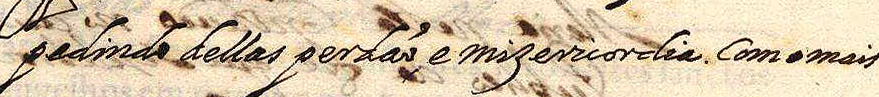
pedindo dellas perdaõ, e mizericordia com o mais
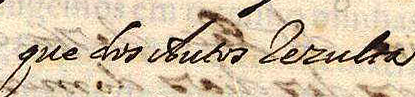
que dos Autos Rezulta.
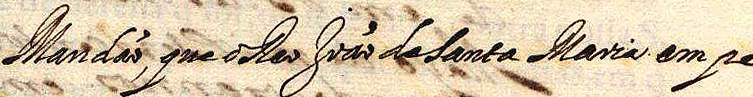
Mandaõ, que o Reo Joaõ de Santa Maria em pe
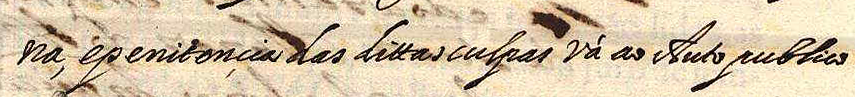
na, e penitençia das dittas culpas vá ao Auto publico
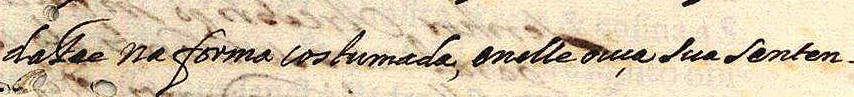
da Fee na forma costumada, e nelle ouça sua senten
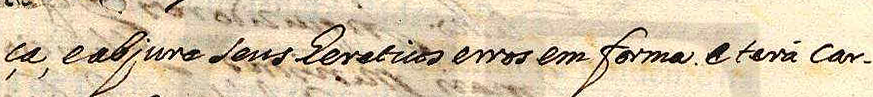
ça, e abjure seus hereticos erros em forma e terá car
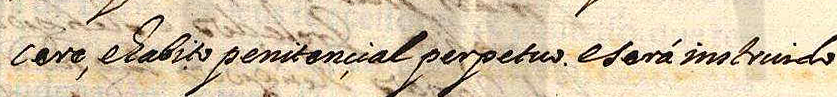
cere, e habito penitençial perpetuo. e será instruido
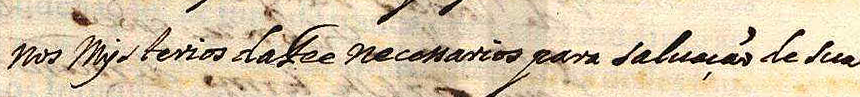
nos Mysterios da Fee necessarios para saluaçaõ de sua
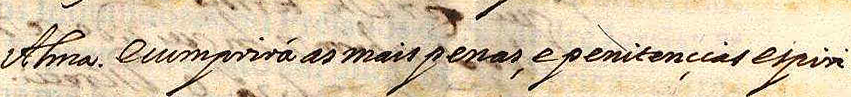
Alma. E cumprirá as mais penas, e penitençias espiri
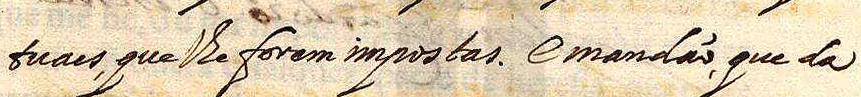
tuaes, que lhe forem impostas. E mandaõ, que da
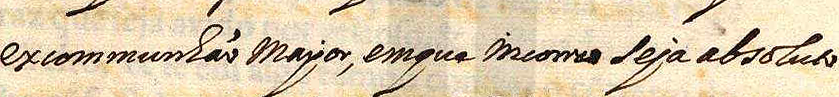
excommunhaõ mayor, em que incorreo seja absoluto
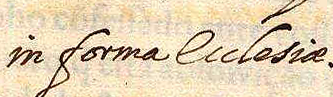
in forma Ecclesiæ.
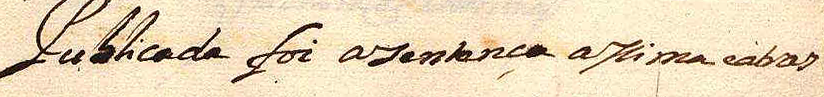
Publicada foi a sentença assima e atras
